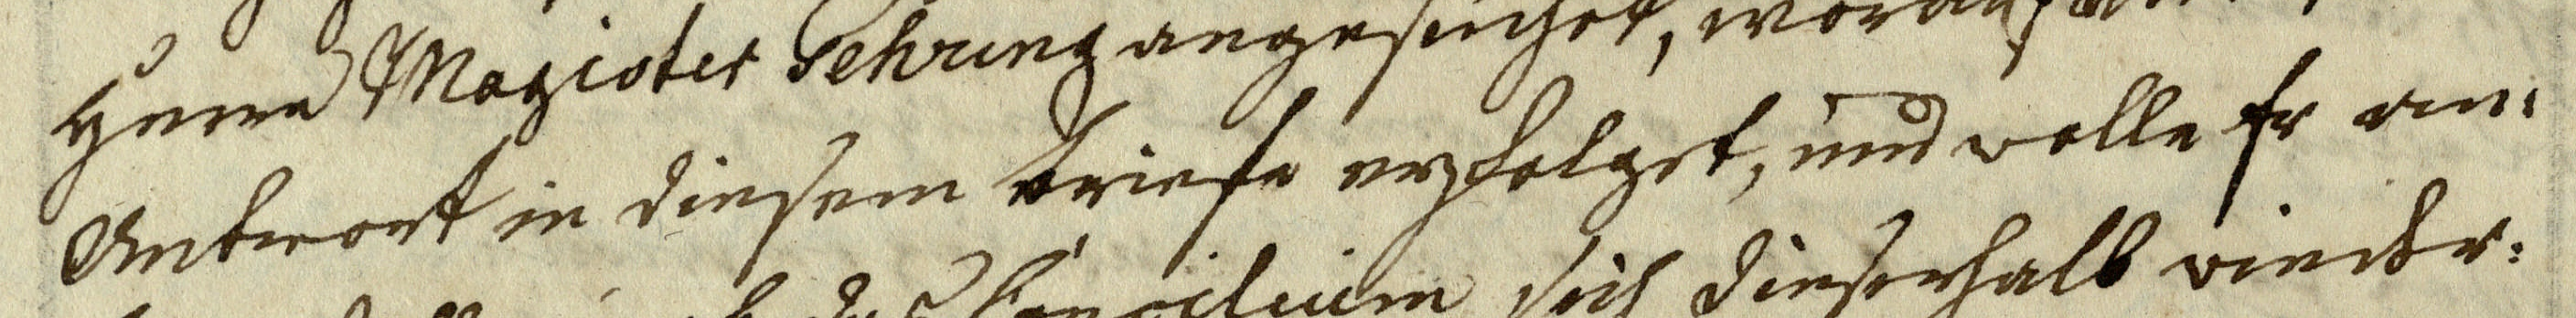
Antwort in diesem Briefe erfolget, und wollte Er an¬
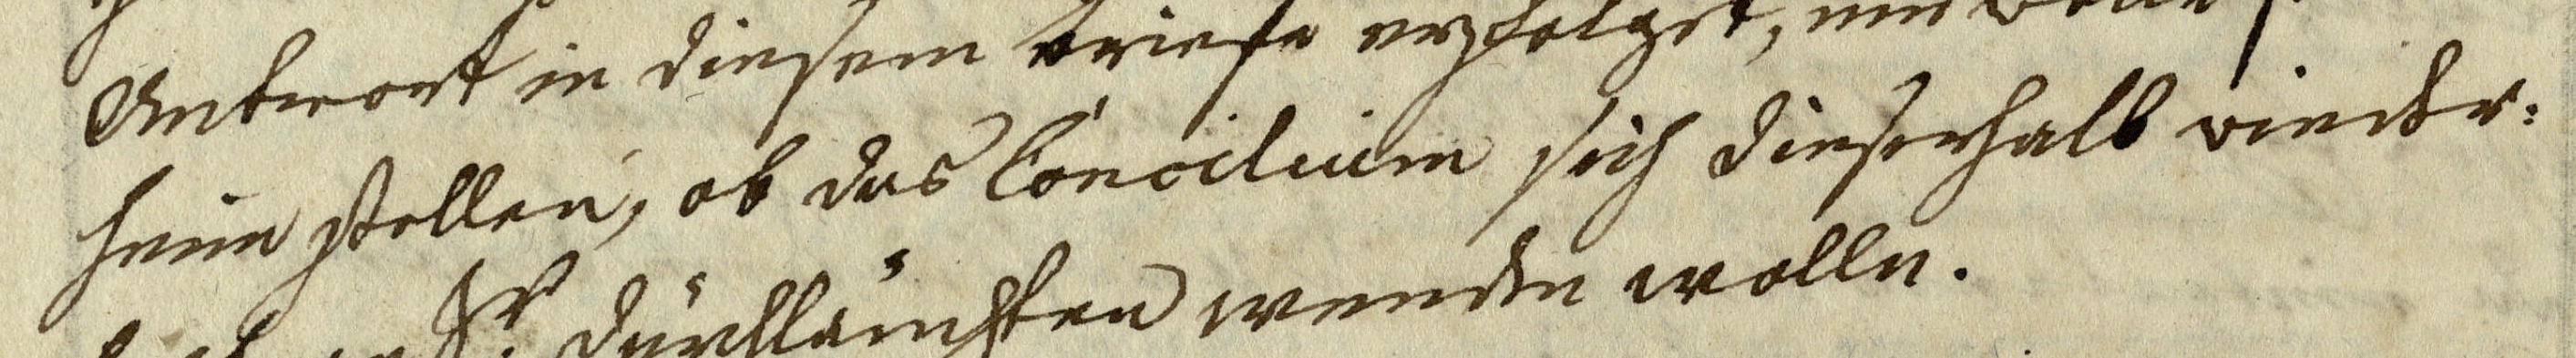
heim stellen, ob das Concilium sich dieserhalb wieder¬
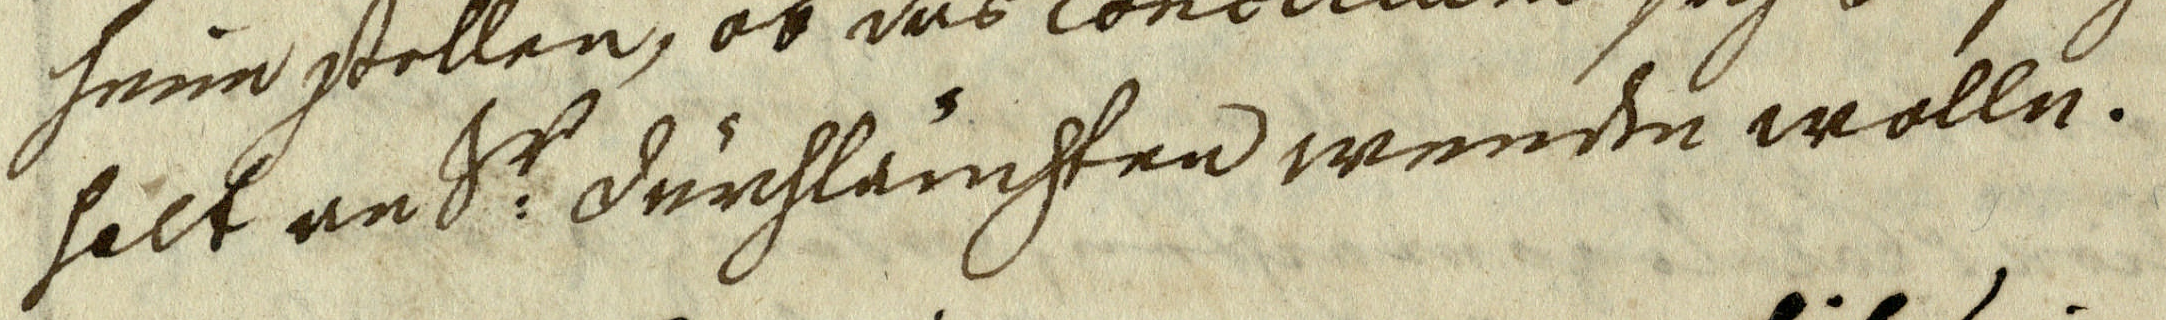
holt an Sr. Durchlauchten wenden wolle.
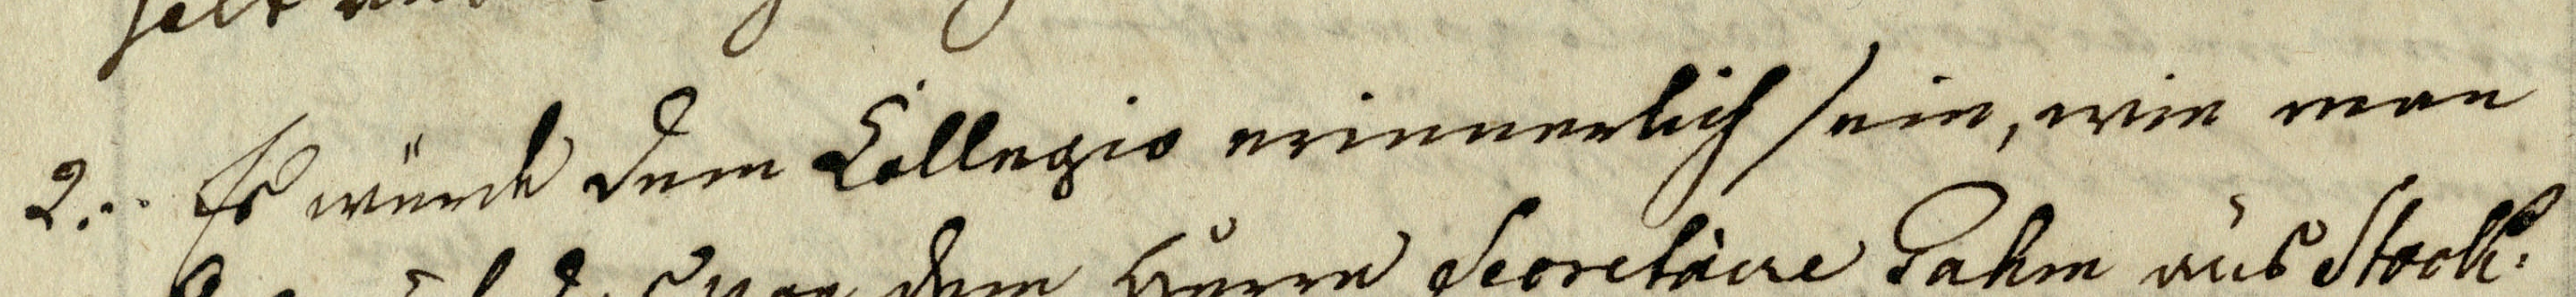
2. Es würde dem Collgio erinnerlich sein, wie man
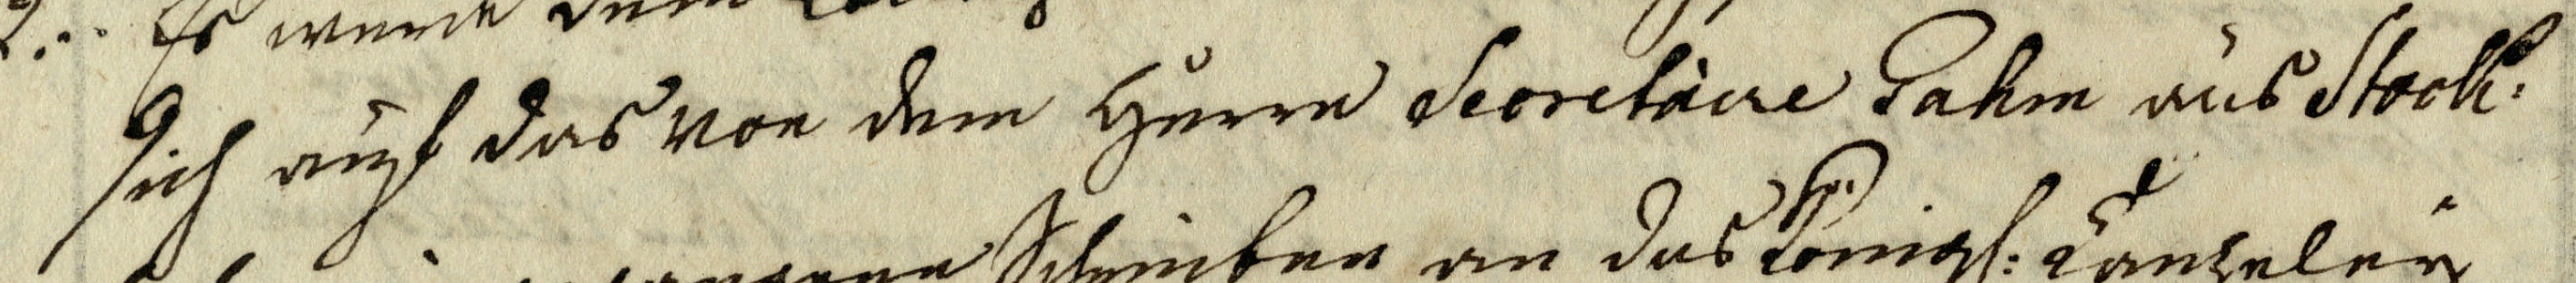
sich auf das von dem Herrn Secretaire Gahm aus Stock¬
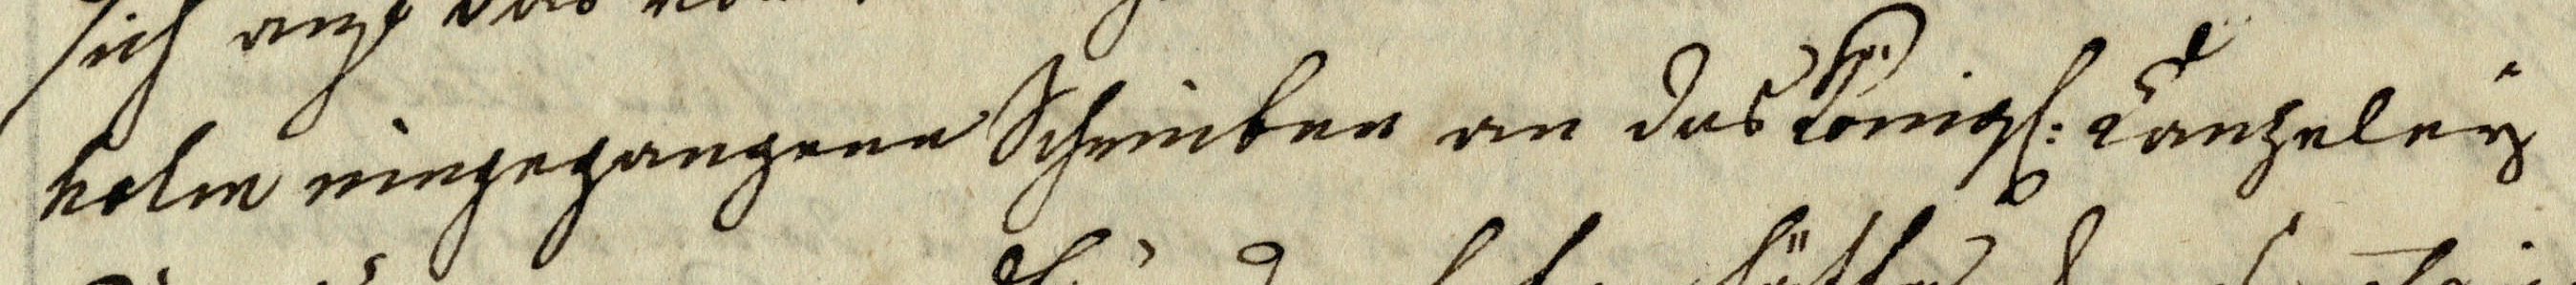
holm eingegangene Schreiben an das Königl. Canzeleÿ
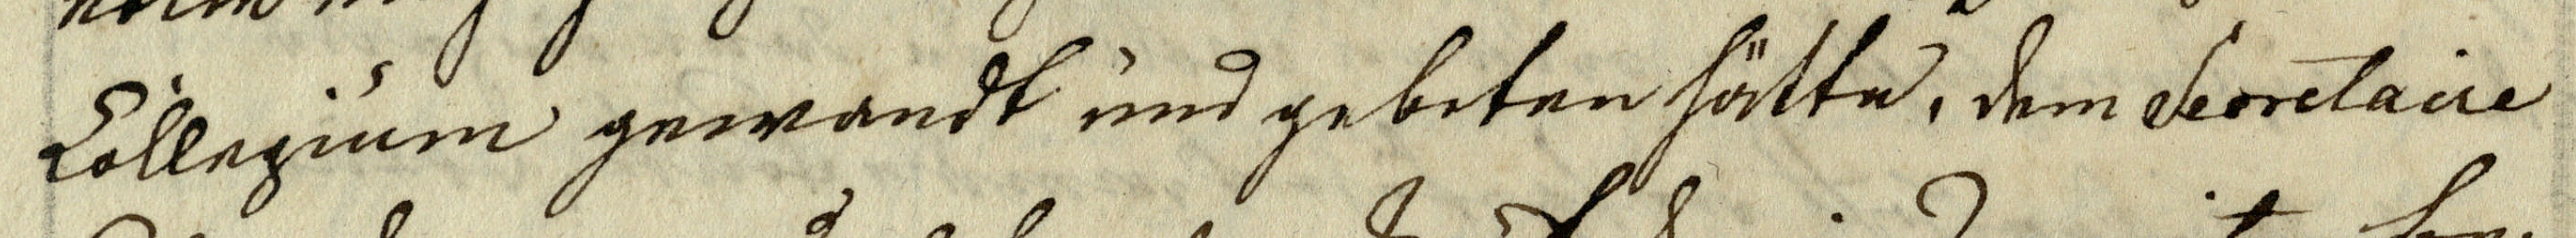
Collegium gewandt und gebeten hätte, dem Secretaire
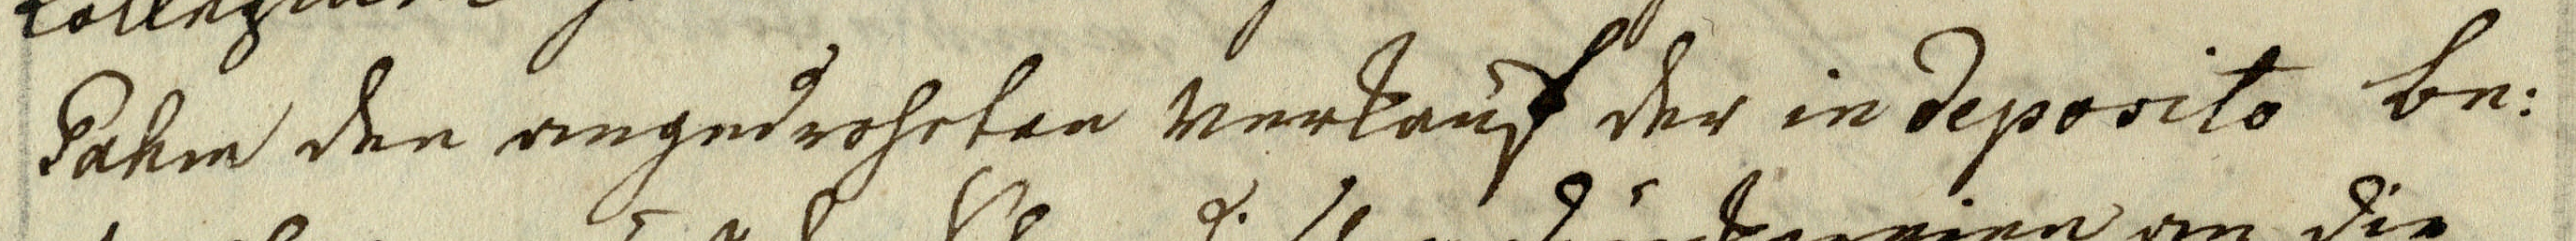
Gahm den angedroheten Verkauf der in deposito be¬
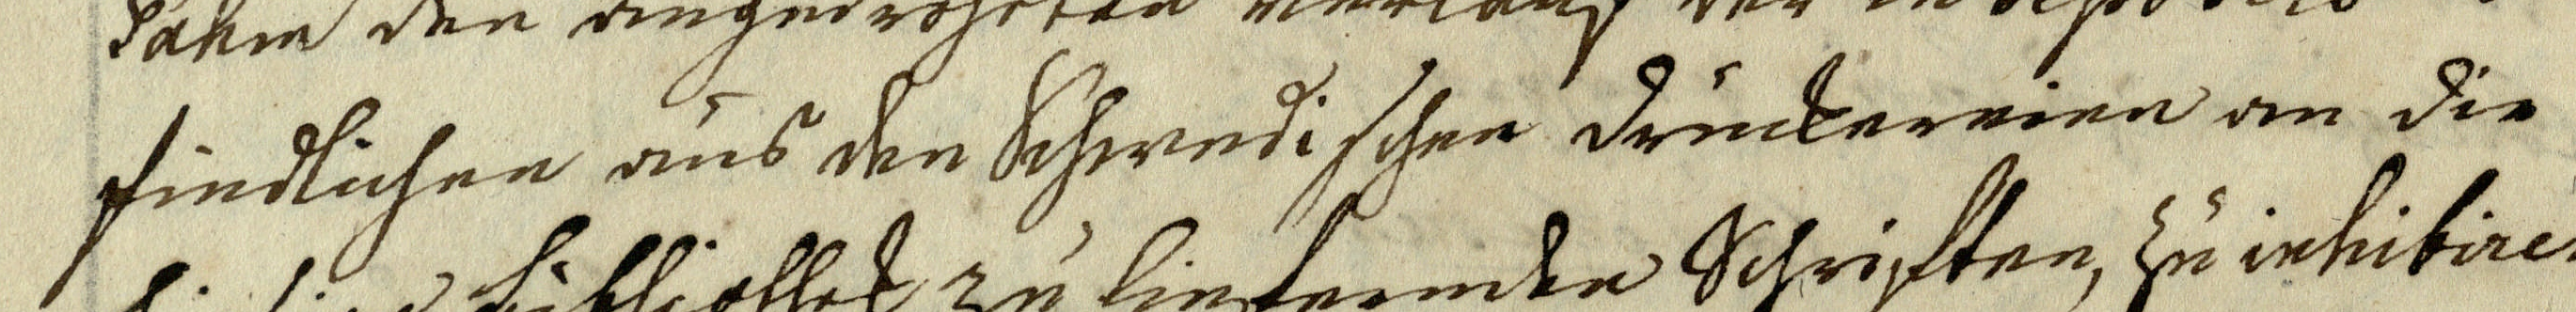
findlichen aus den schwedischen Druckereien an die
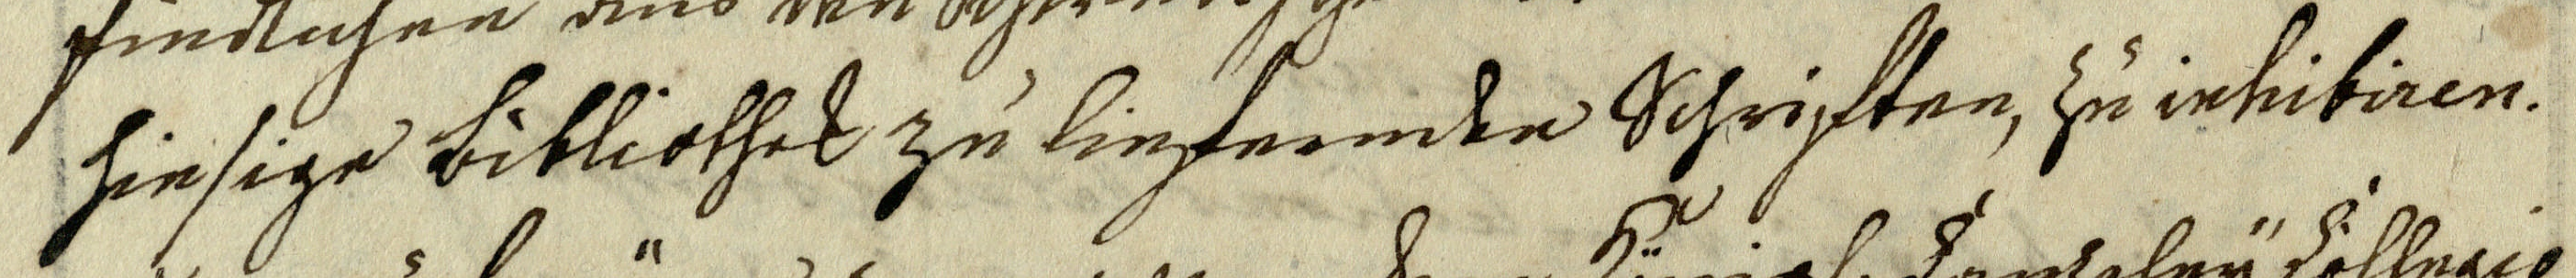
hiesige Bibliothek zu liefernden Schriften, zu inhibiren.
